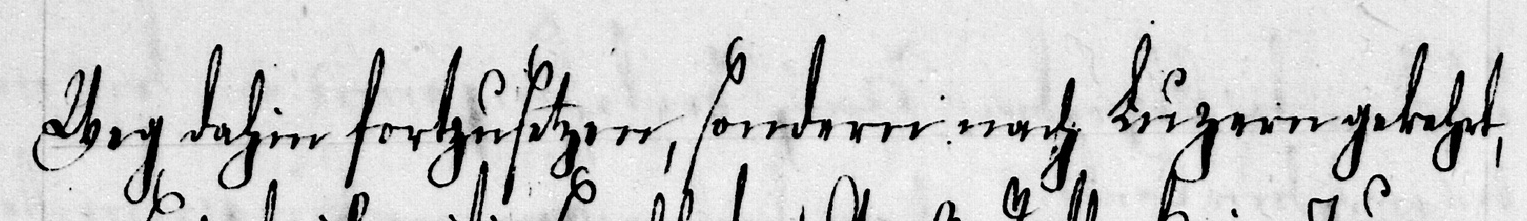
Weg dahin fortzusetzen, sondern nach Luzern gekehrt,
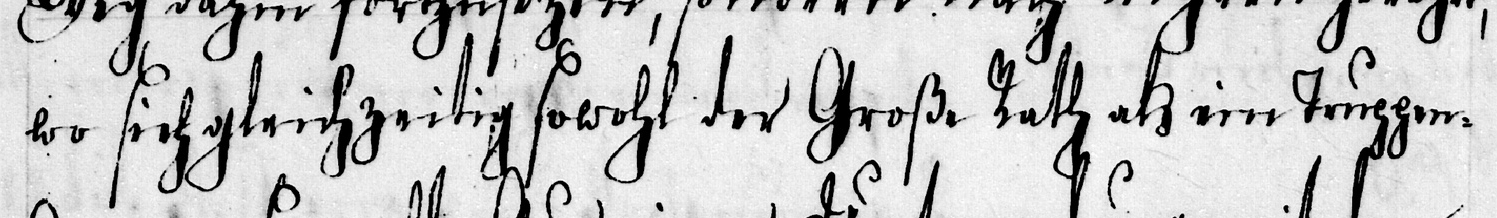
wo sich gleichzeitig sowohl der Große Rath als ein Truppe¬
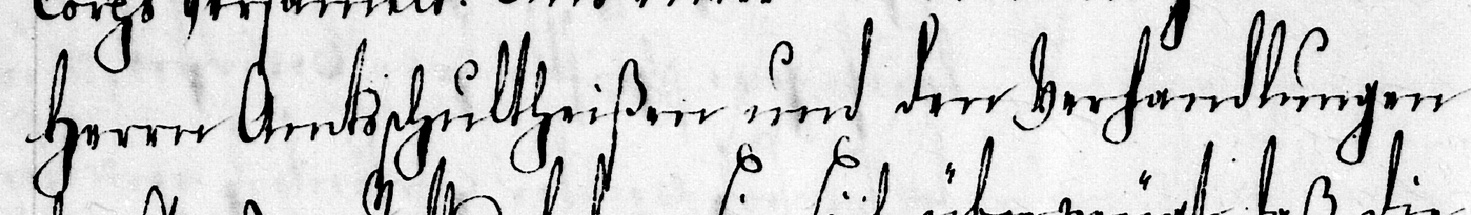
Herrn Amtsschultheißen und den Verhandlungen
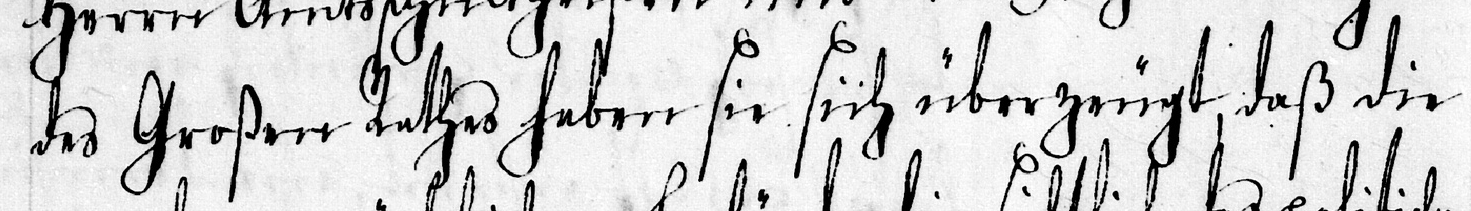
des Großen Rathes haben sie sich überzeugt, daß die
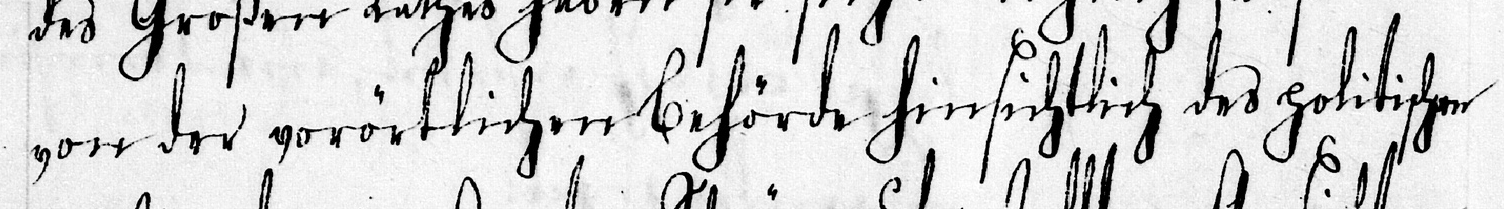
von der vorörtlichen Behörde hinsichtlich des politisch¬
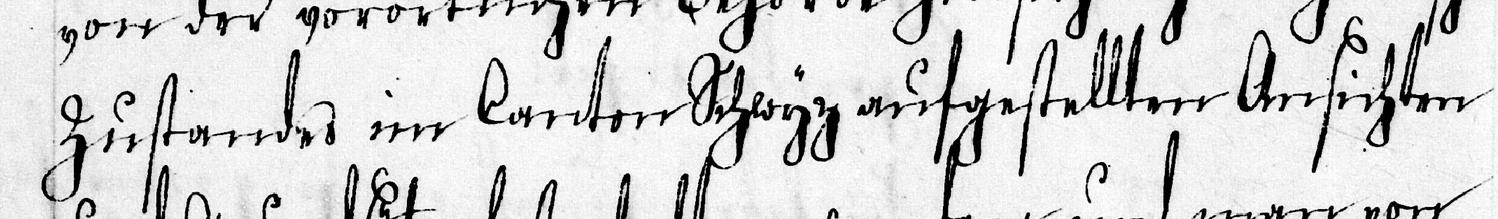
Zustandes im Canton Schwyz aufgestellten Ansichten
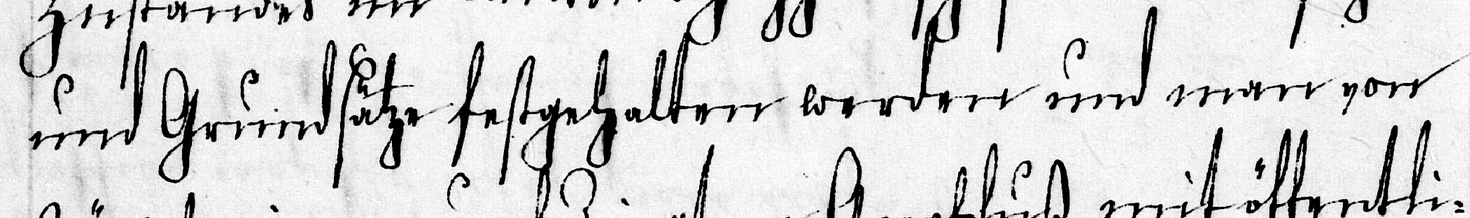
und Grundsätze festgehalten werden und man von
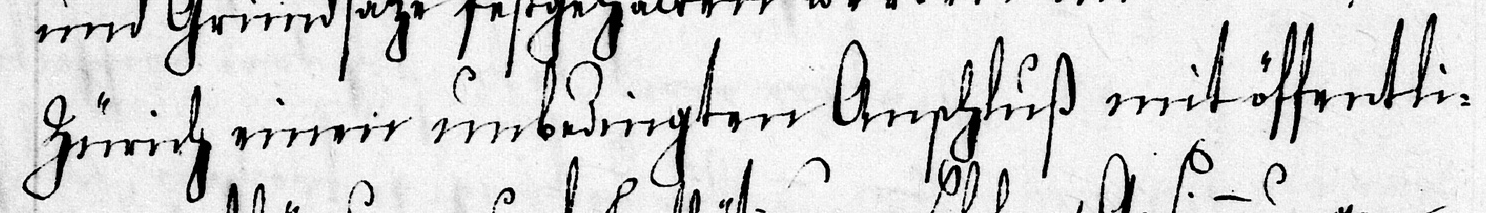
Zürich einen unbedingten Anschluß mit öffentli¬
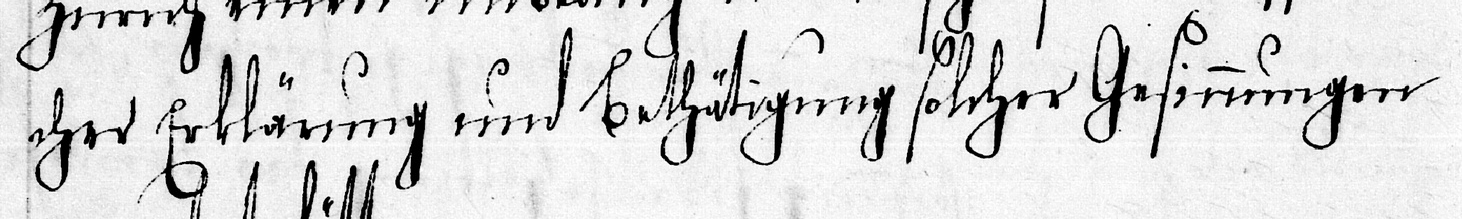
cher Erklärung und Bethätigung solcher Gesinnungen
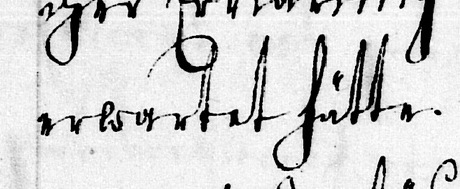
et hätte.
